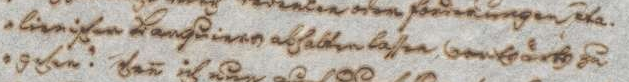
lienischer Banquiers abhalten lassen, vorwärts zu
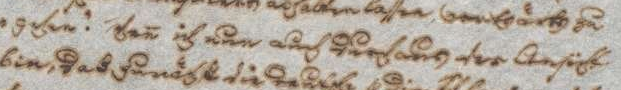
gehen.» Wenn ich nun auch durchaus der Ansicht
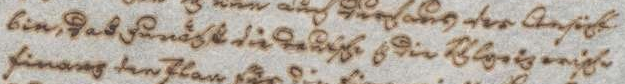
bin, daß zunächst die Deutsche & die Schweizerische
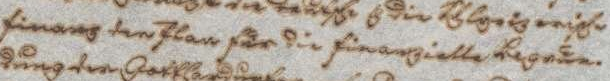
Finanz den Plan für die finanzielle Begrün-
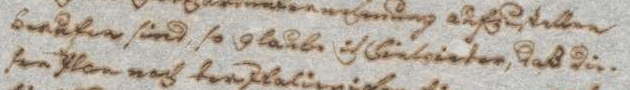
berufen sind, so glaube ich hinwieder, daß die-
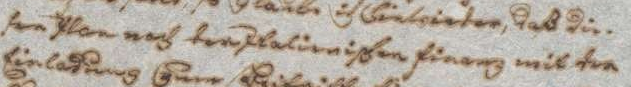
ser Plan noch der Italienischen Finanz mit der
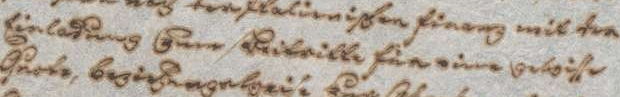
Einladung zum Beitritte für eine gewisse
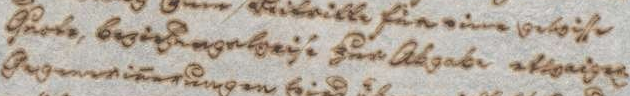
Quote, beziehungsweise zur Abgabe etwaiger
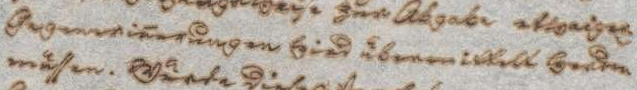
Gegenerinnerungen wird übermittelt werden
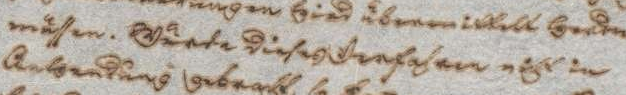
müssen. Würde dieses Verfahren nicht in
